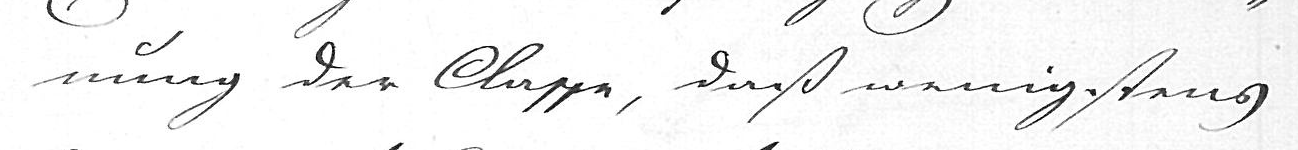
nung der Classe, daß wenigstens
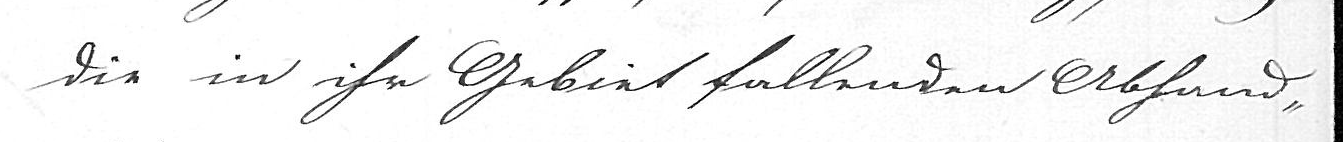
die in ihr Gebiet fallenden Abhand-
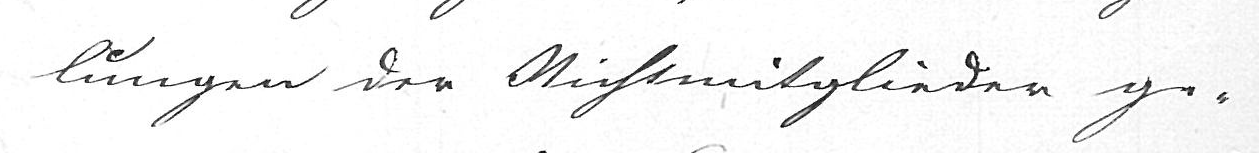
lungen der Nichtmitglieder ge-
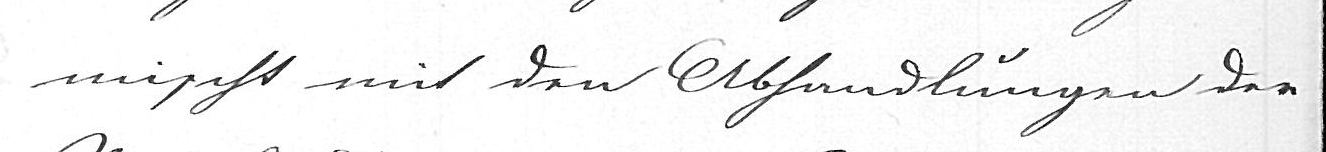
mischt mit den Abhandlungen der
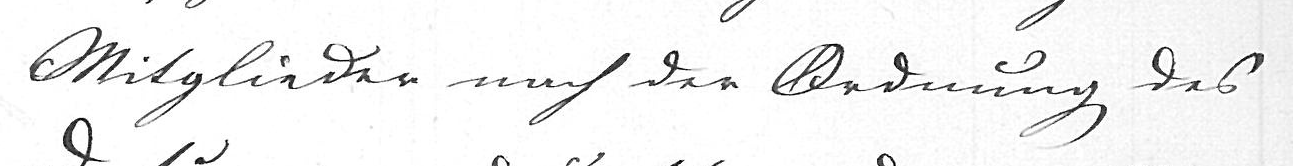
Mitglieder nach der Ordnung des
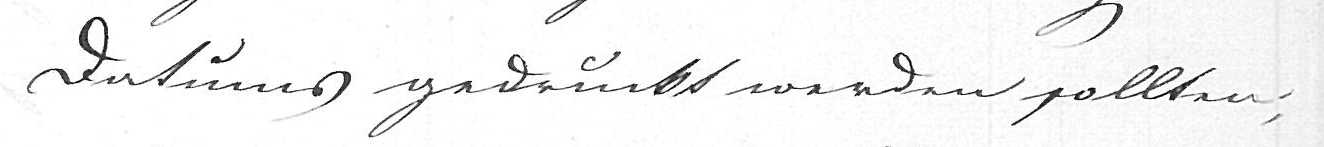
Datums gedruckt werden sollten,
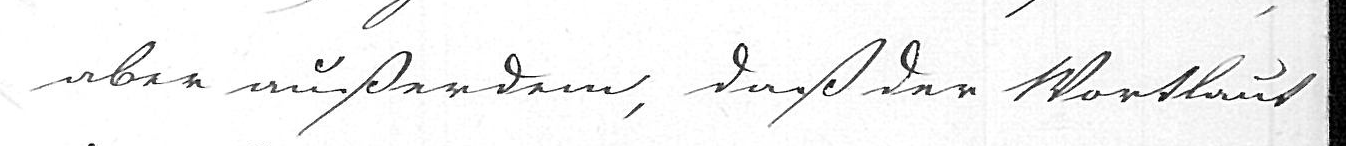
aber außerdem, daß der Wortlaut
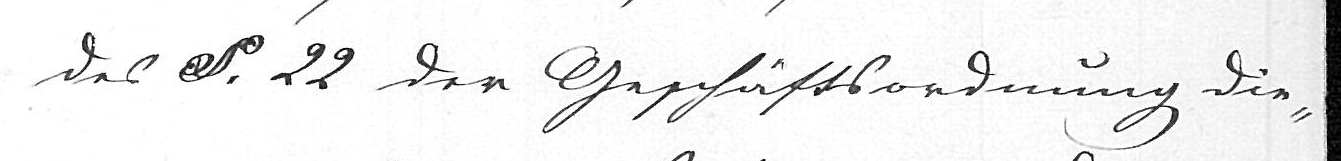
des § 22 der Geschäftsordnung die-
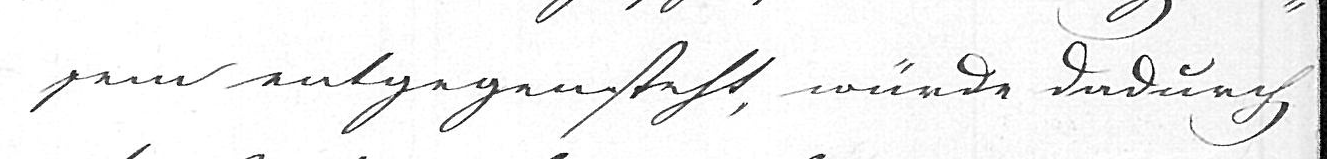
sem entgegensteht, würde dadurch
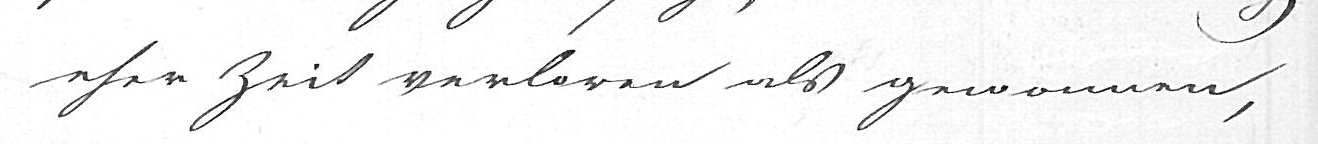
eher Zeit verloren als gewonnen,
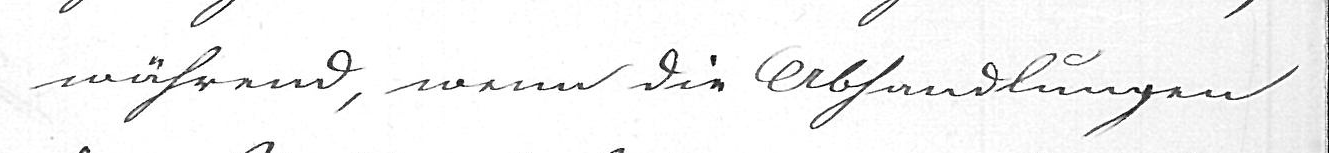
während, wenn die Abhandlungen
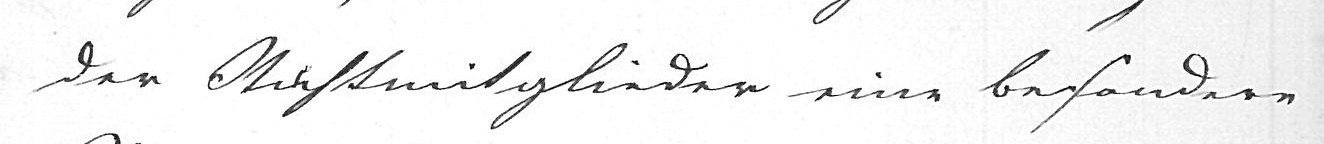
der Nichtmitglieder eine besondere
